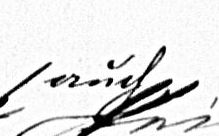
auch
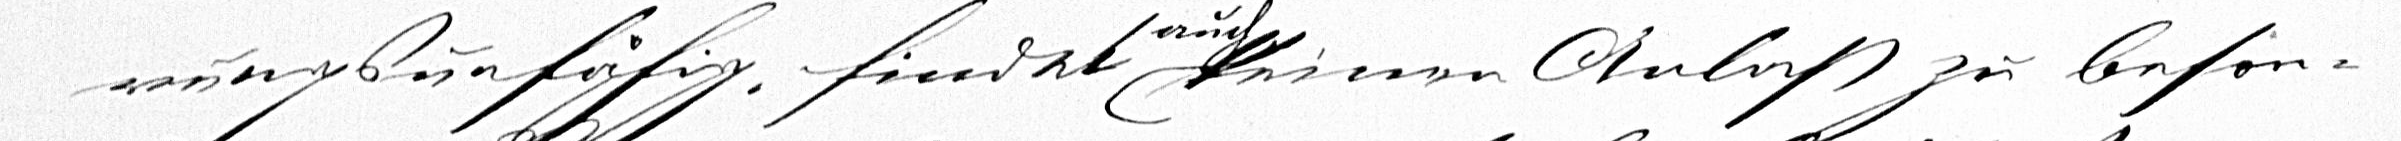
rungsunfähig, findet keinen Anlaß zu beson¬
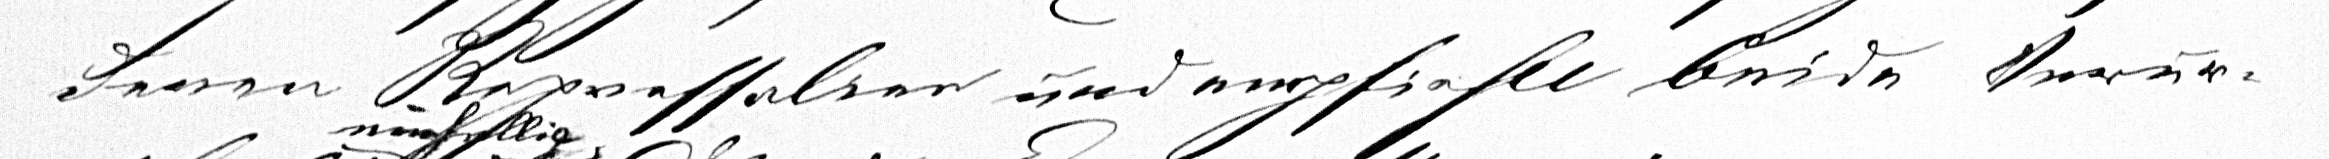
denen Repressalien und empfiehl beide Verur¬
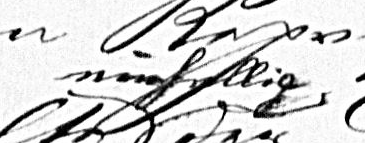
einfellig
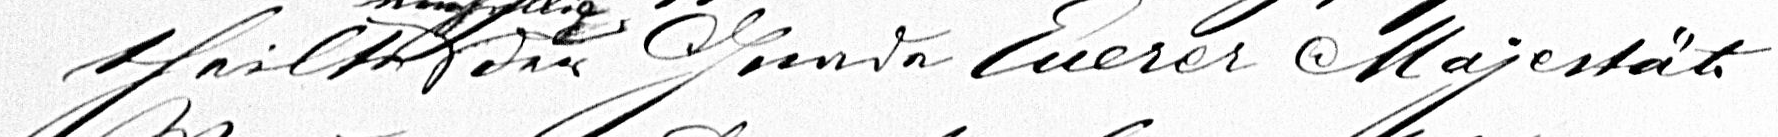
theilte der Gnade Euerer Majestät.
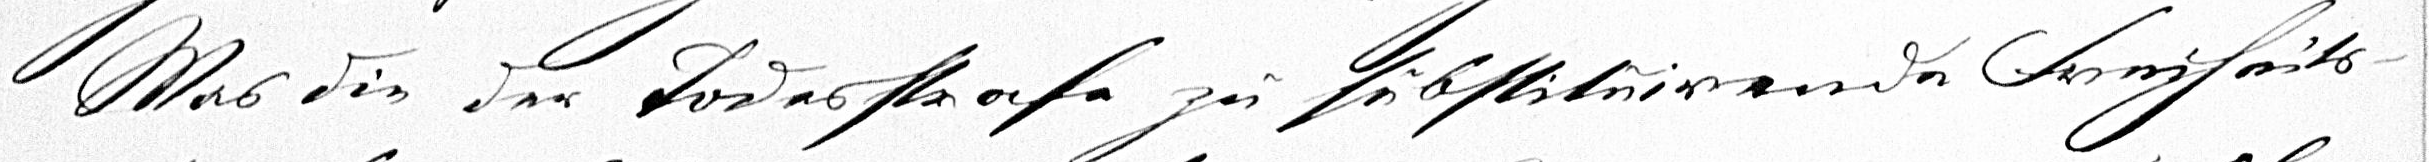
Was die der Todesstrafe zu substituirende Freiheits¬
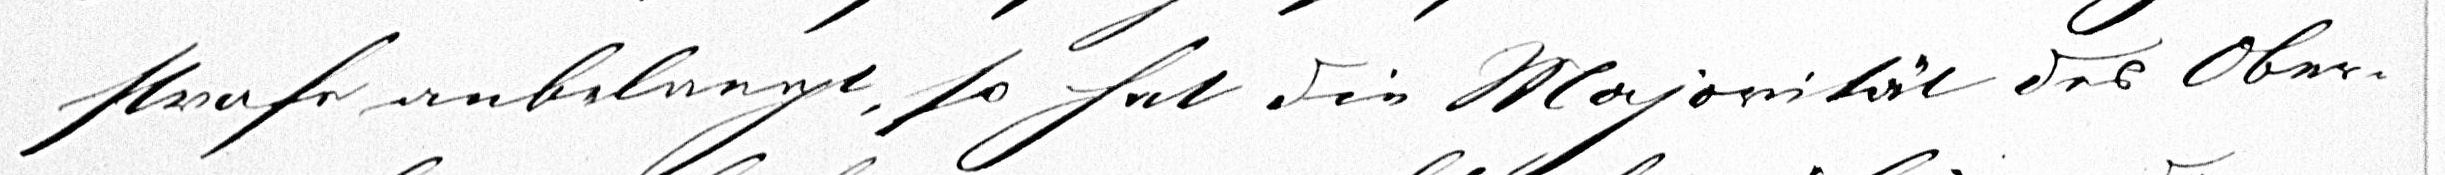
strafe anbelangt, so hat die Majorität des Ober¬
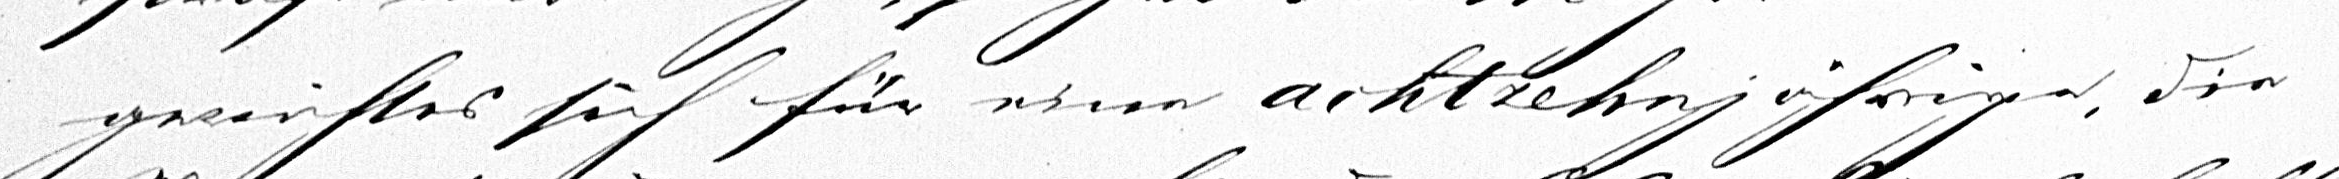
gerichtes sich für eine achtzehnjährige, die
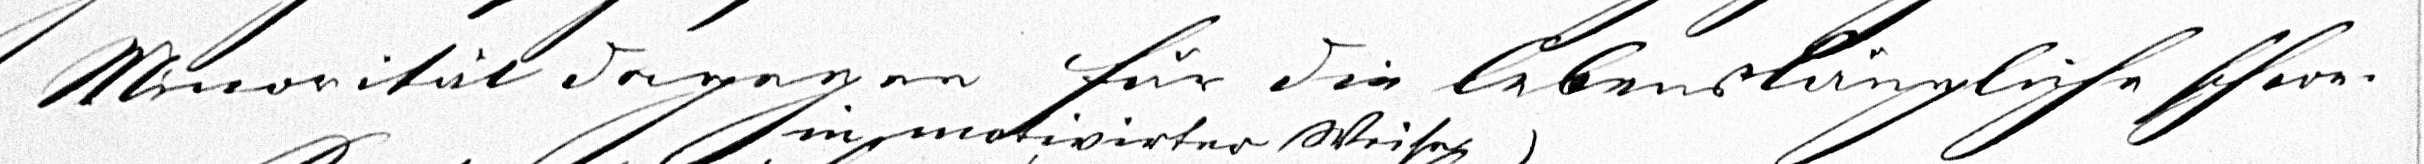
Minorität dagegen für die lebenslängliche schwe¬
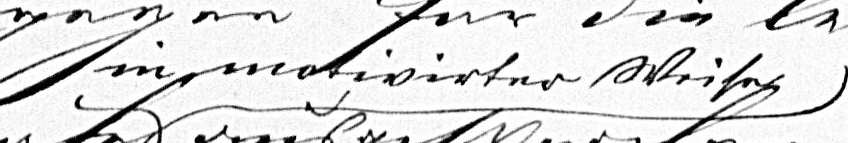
in motivirter Weise
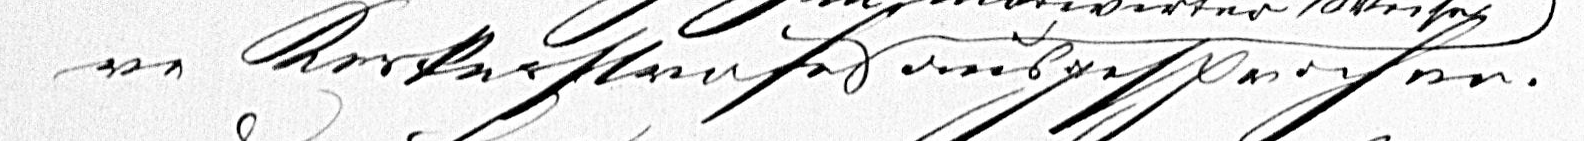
re Kerkerstrafe ausgesprochen.
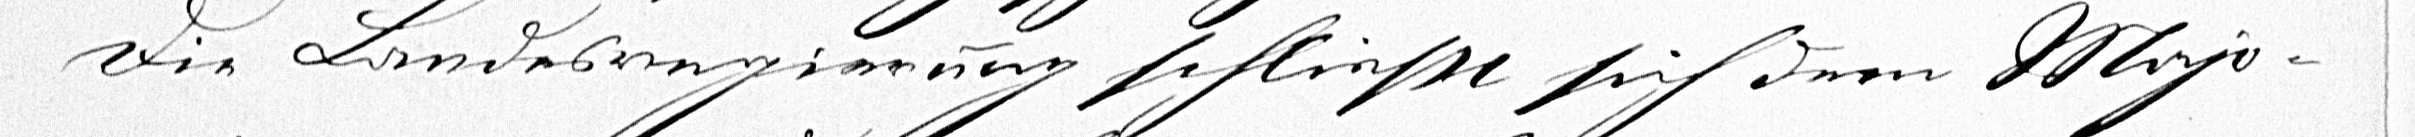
Die Landesregierung schließt sich dem Majo¬
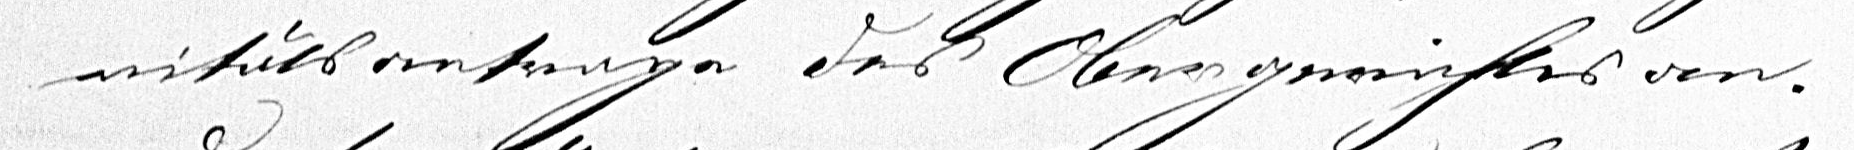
ritätsantrage des Obergerichtes an.
